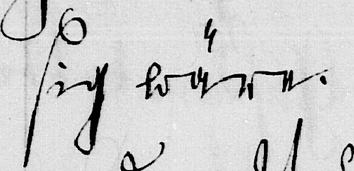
sig wäre.
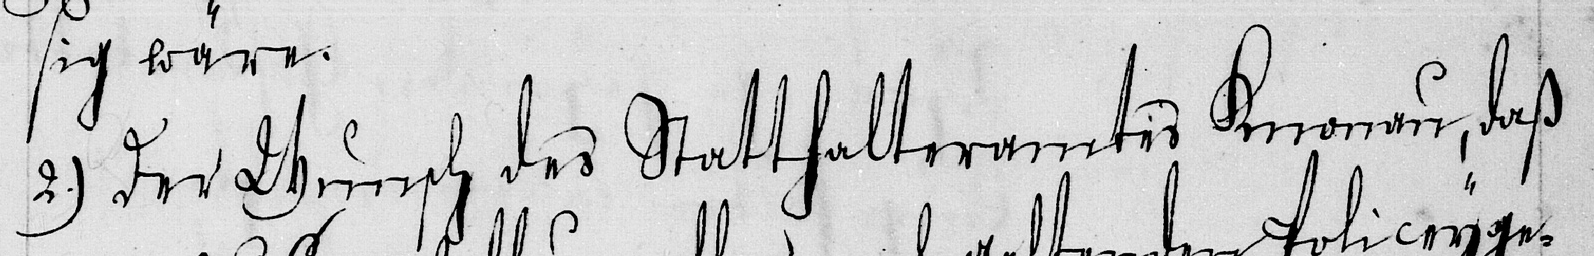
2.) Der Wunsch des Statthalteramtes Knonau, daß
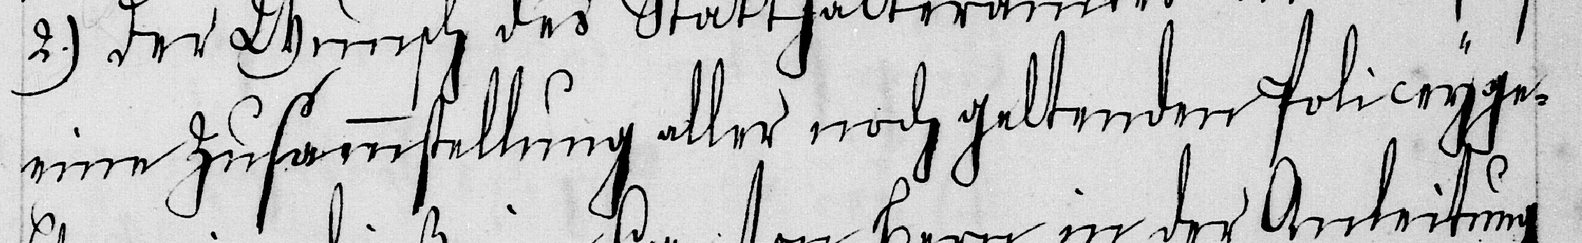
eine Zusammstellung aller noch geltenden Policeyge¬
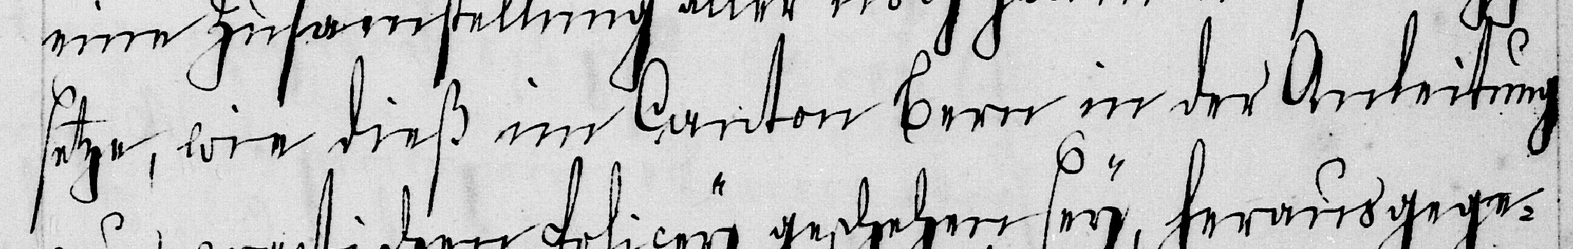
setze, wie dieß im Canton Bern in der Anleitung
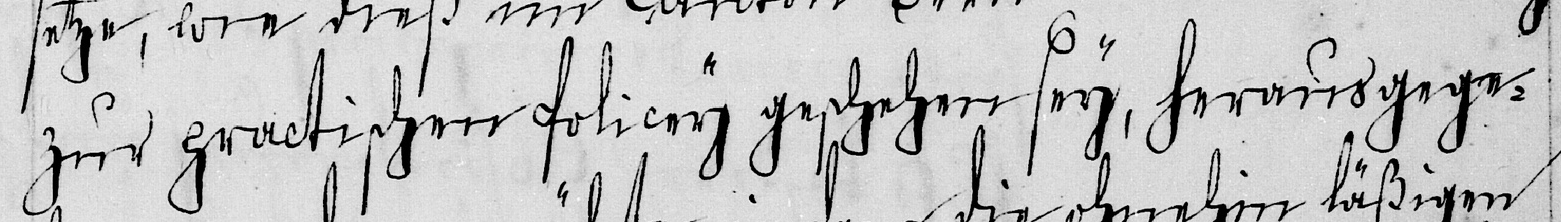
zur practischen Policey geschehen sey, herausgege¬
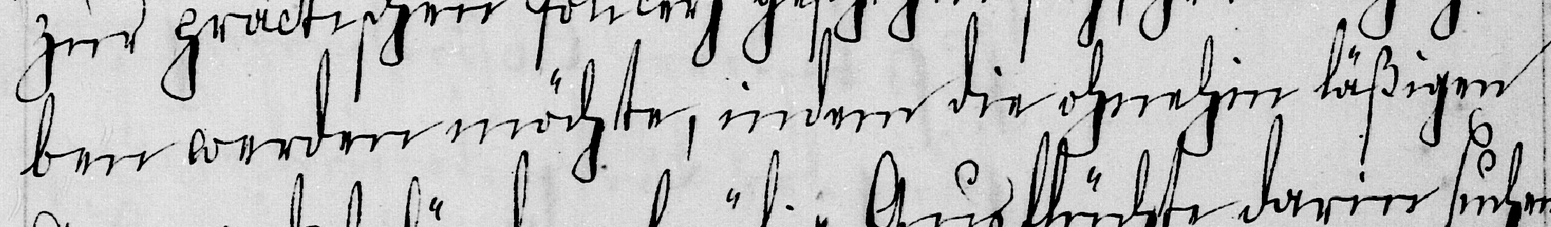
ben werden möchte, indem die ohnehin läßigen
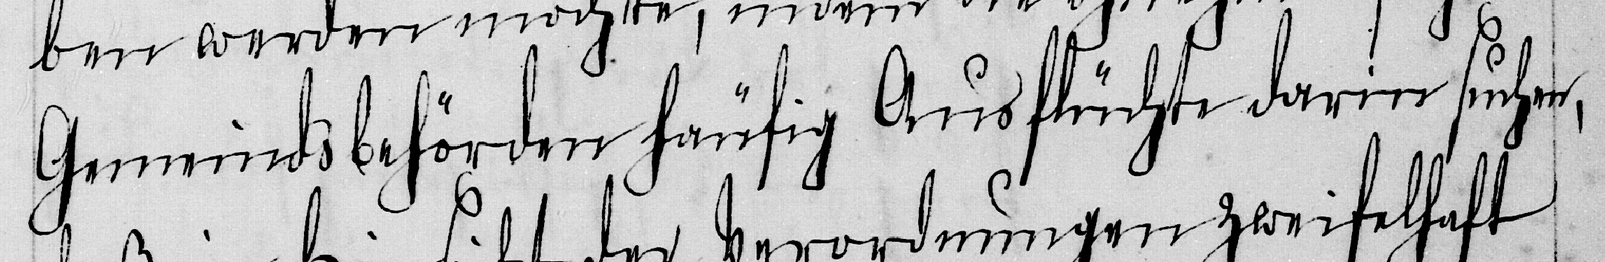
Gemeindsbehörden häufig Ausflüchte darin suchen,
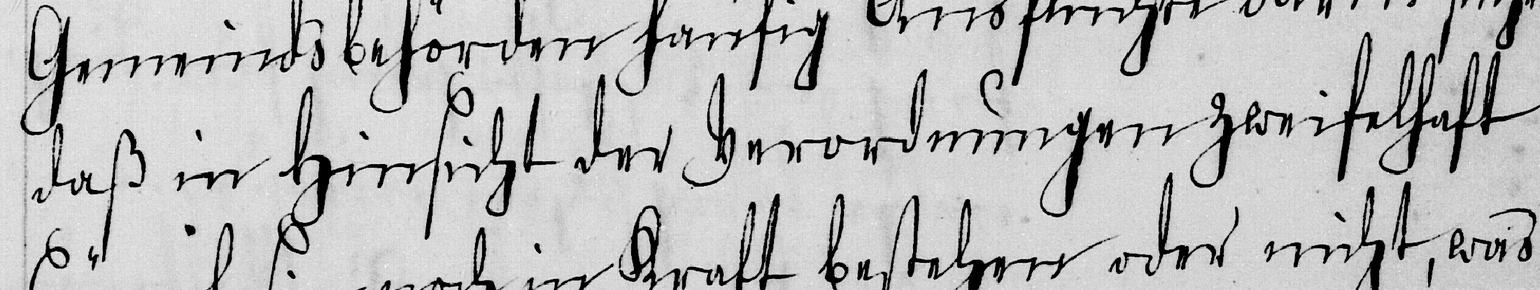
daß in Hinsicht der Verordnungen zweifelhaft
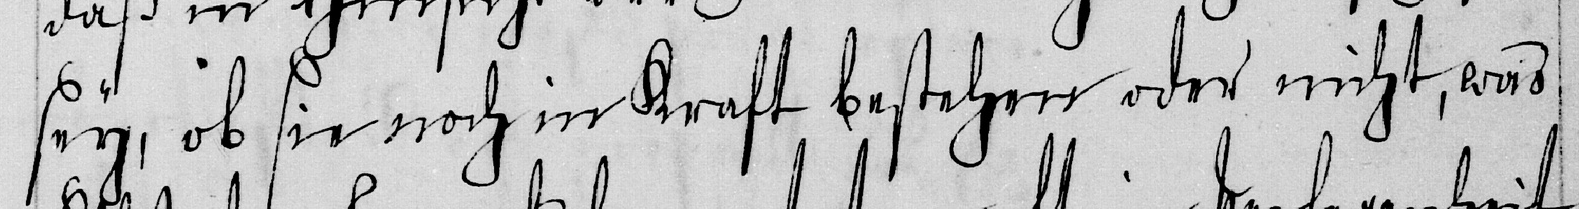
sey, ob sie noch in Kraft bestehen oder nicht, was
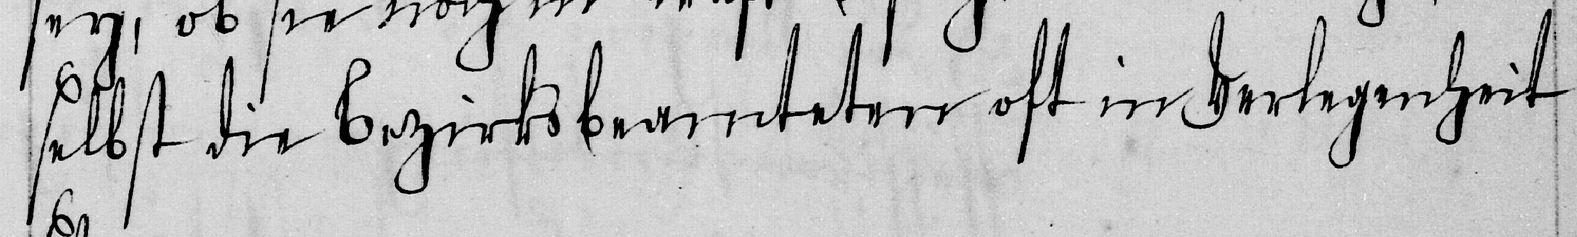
selbst die Bezirksbeamteten oft in Verlegenheit
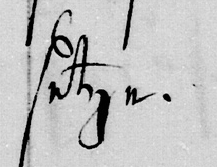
setze.
